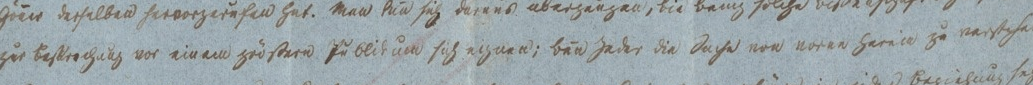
zur Besprechung vor einem grössern Publikum sich eignen; wenn Jeder die Sache von vorne herein zu verstehen
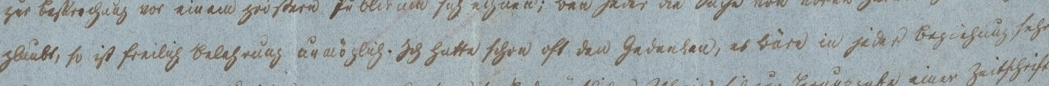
glaubt, so ist freilich Belehrung unmöglich. Ich hatte schon oft den Gedanken, es wäre in jeder Beziehung sehr
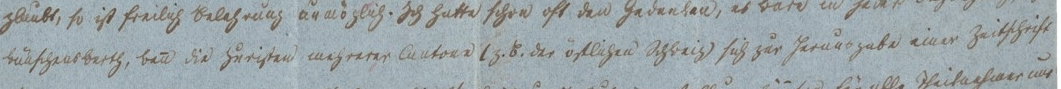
wünschenswerth, wenn die Juristen mehrerer Cantone (z. B. der östlichen Schweiz) sich zur Herausgabe einer Zeitschrift
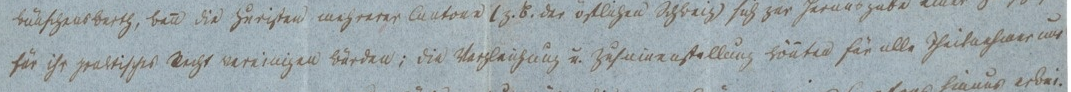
für ihr praktisches Recht vereinigen würden; die Vergleichung u. Zusammenstellung könnten für alle Theilnehmer nur
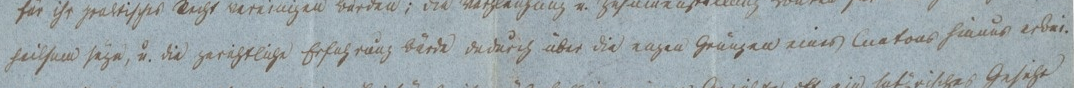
heilsam seyn, u. die gerichtliche Erfahrung würde dadurch über die engen Gränzen eines Cantons hinaus erwei-
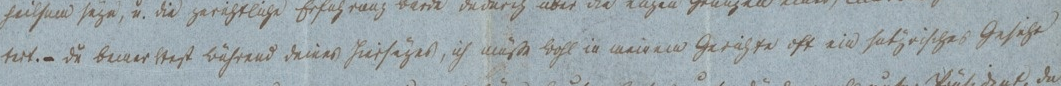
tert. – Du bemerktest während deines Hierseyns, ich müsse wohl in meinem Gerichte oft ein satyrisches Gesicht
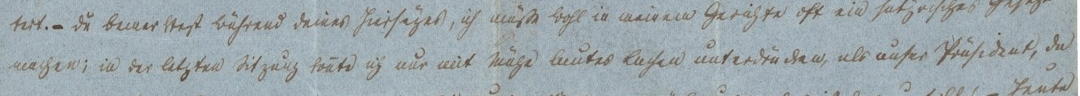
machen; in der letzten Sitzung konnte ich nur mit Mühe lautes Lachen unterdrücken, als unser Präsident, da
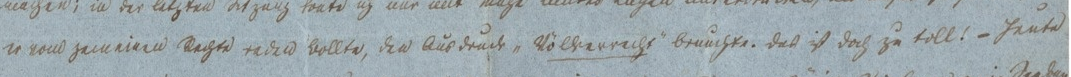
er vom gemeinen Rechte reden wollte, den Ausdruck «Völkerrecht» brauchte. Das ist doch zu toll! – Heute
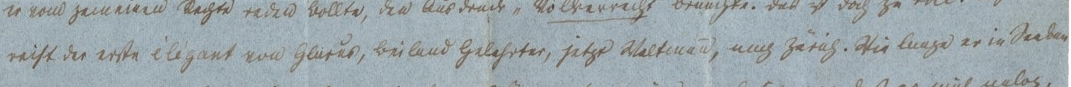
reist der erste élégant von Glarus, weiland Gelehrter, jetzt Weltmann, nach Zürich. Wie lange er in Seewen
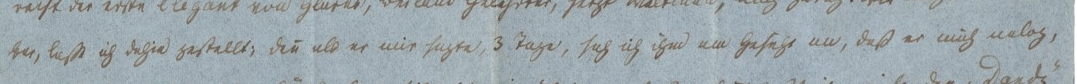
war, lasse ich dahin gestellt; denn als er mir sagte, 3 Tage, sah ich ihm am Gesicht an, daß er mich anlog,
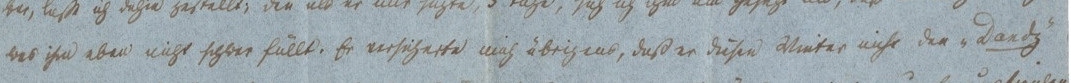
was ihm eben nicht schwer fällt. Er versicherte mich übrigens, daß er diesen Winter nicht den «Dandy»
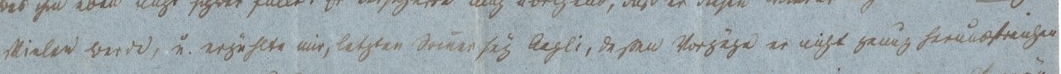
spielen werde, u. erzählte mir, letzten Sommer sey Aepli, dessen Vorzüge er nicht genug herausstreichen
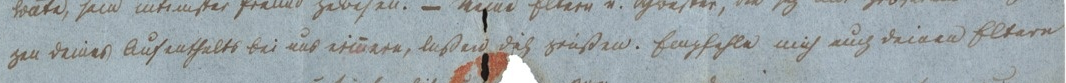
gen deines Aufenthalts bei uns erinnern, lassen dich grüßen. Empfehle mich auch deinen Eltern
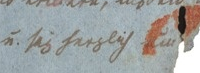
herzlich umarmt
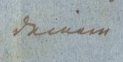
Deinem
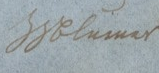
J J Blumer.
